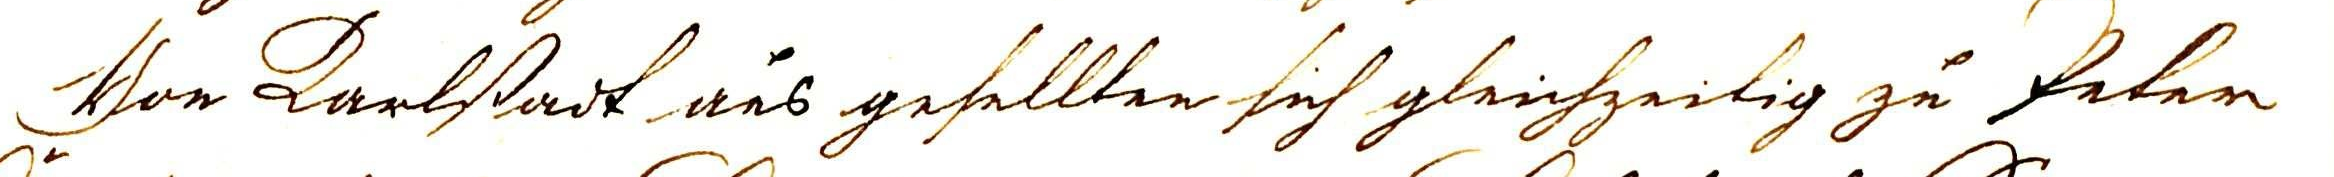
Von Carlstadt aus gesellten sich gleichzeitig zu Peter
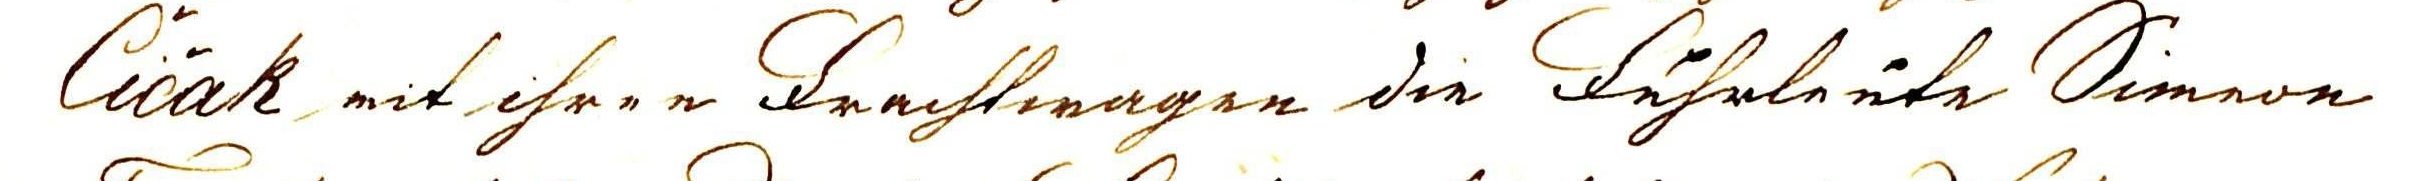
Čičak mit ihren Frachtwagen die Fuhrleute Simeon
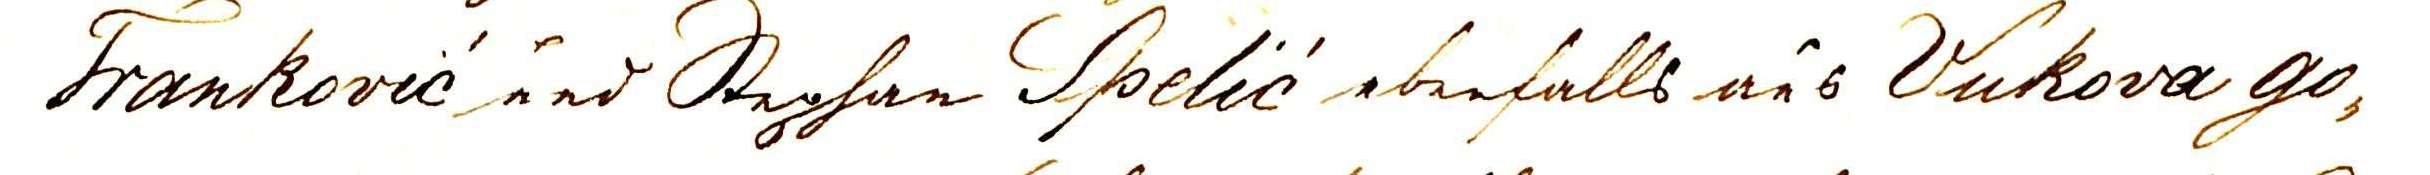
Franković und Stephan Spelić ebenfalls aus Vukova go¬
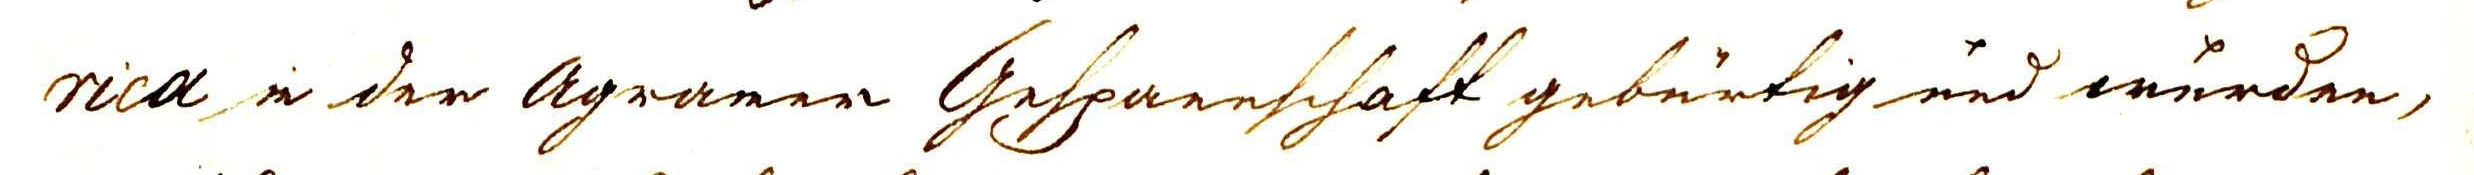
rica in der Agramer Gespannschaft gebürtig und wurden,
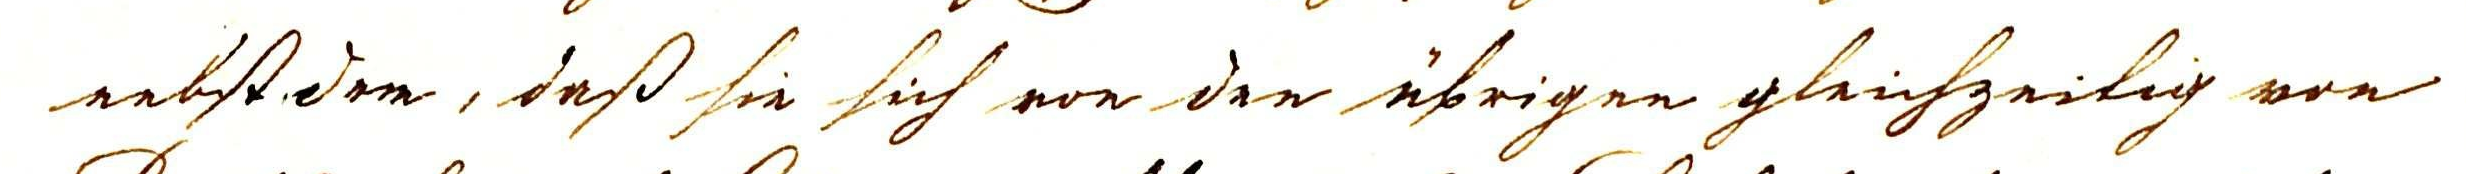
nebst dem, daß sie sich von den übrigen gleichzeitig von
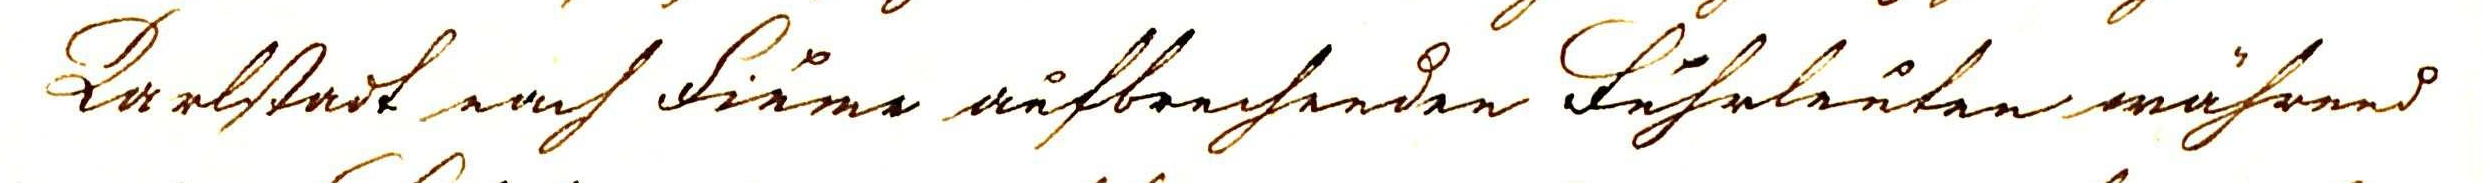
Carlstadt nach Fiume aufbrechenden Fuhrleute während
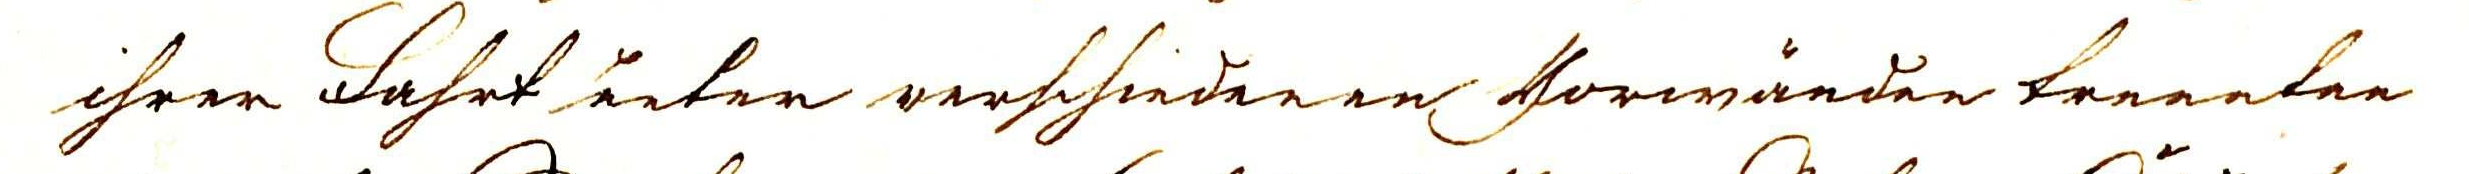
ihrer Fahrt unter verschiedenen Vorwänden trennten
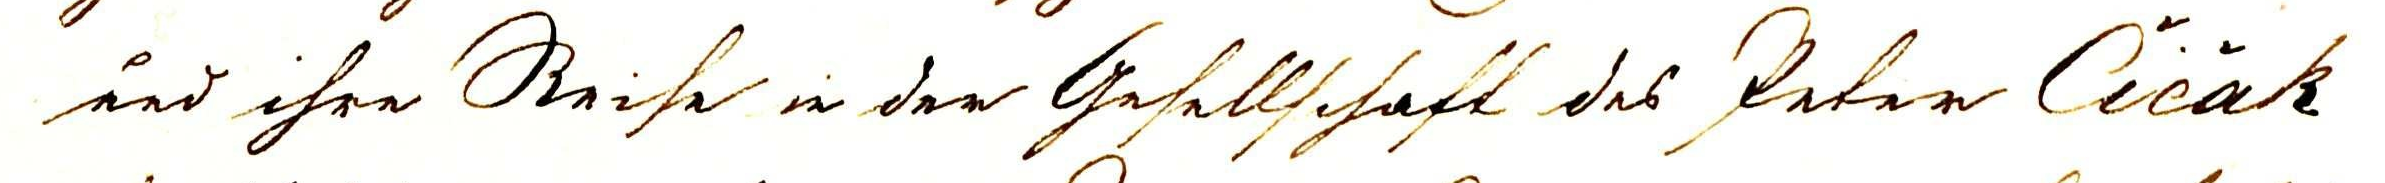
und ihre Reise in der Gesellschaft des Peter Čičak
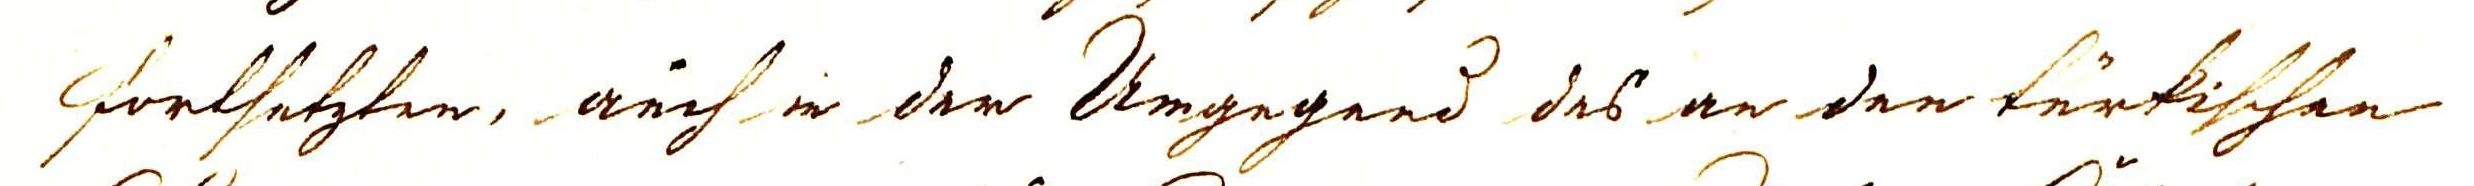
fortsetzten, auch in der Umgegend des an den türkischen
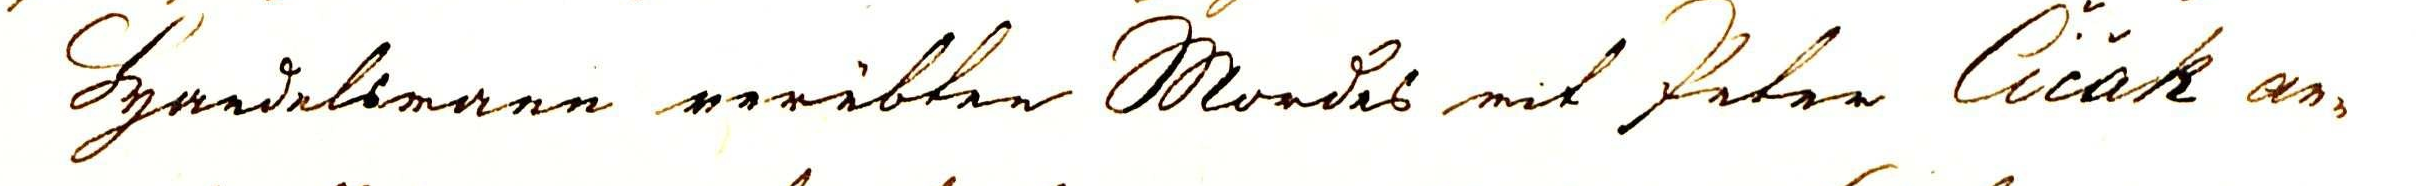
Handelsmann verübter Mordes mit Peter Čičak an¬
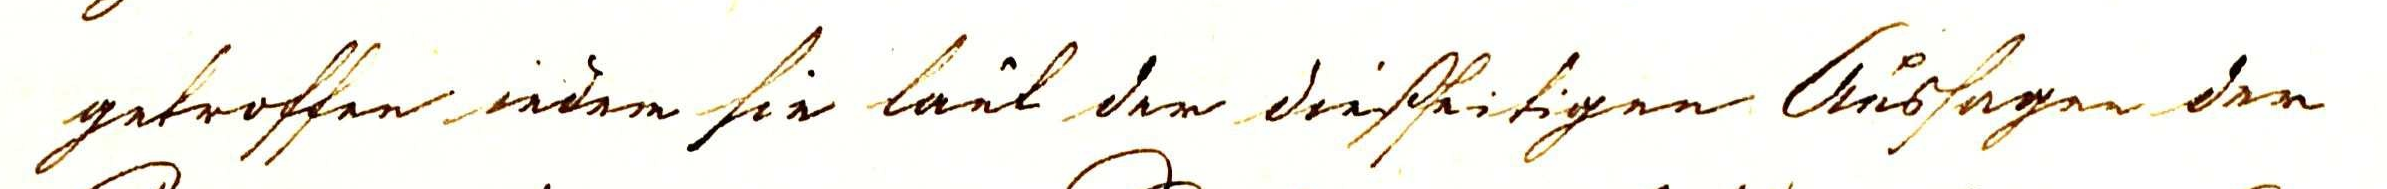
getroffen inden sie laut der diesseitigen Aussagen der
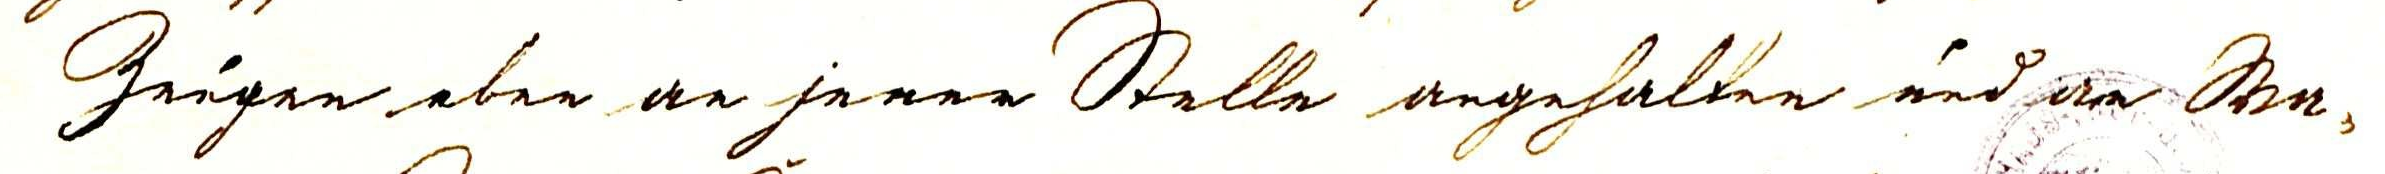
Zeugen aber an jener Stelle angehalten und am Wa¬
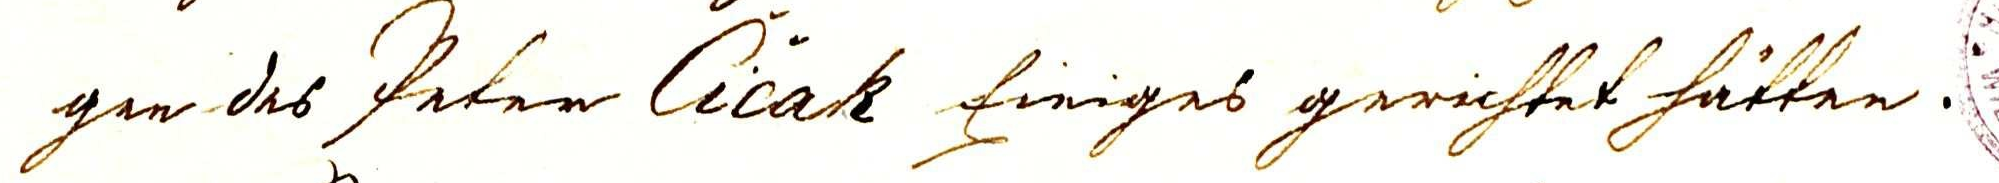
gen des Peter Čičak Einiges gerichtet hätten.
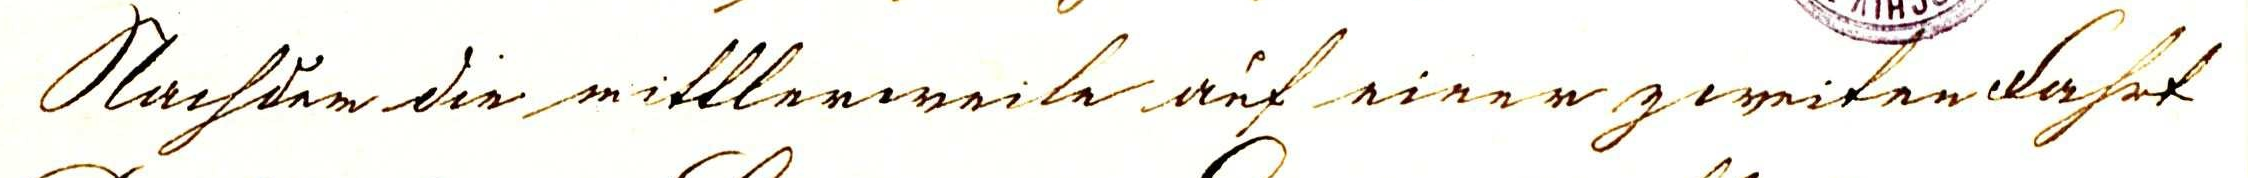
Nachdem die mittlerweile auf einer zweiten Fahrt
